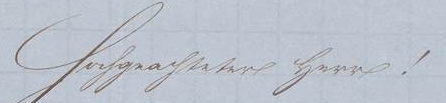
Hochgeachteter Herr!
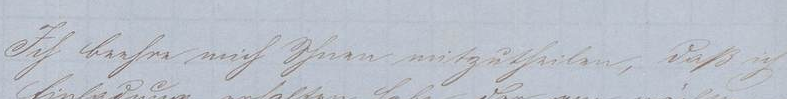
Ich beehre mich Ihnen mitzutheilen, daß ich
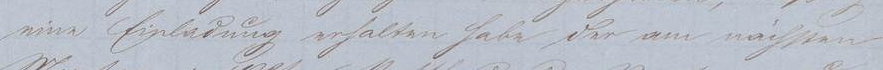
eine Einladung erhalten habe, der am nächsten
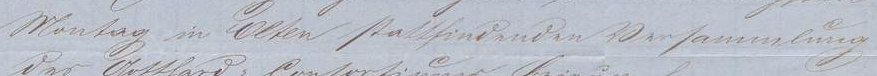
Montag in Olten stattfindenden Versammlung
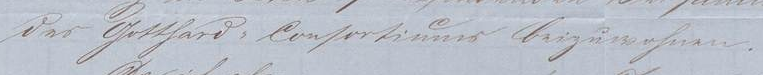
des Gotthard-Consortiums beizuwohnen
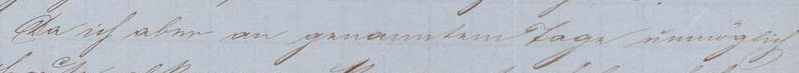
Da ich aber an genanntem Tage unmöglich
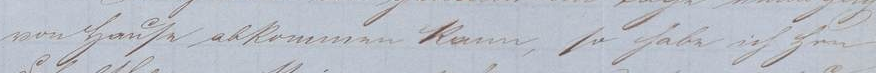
von Hause abkommen kann, so habe ich Hrn
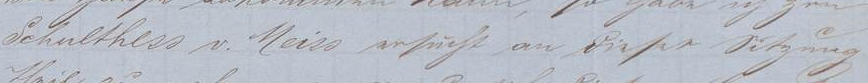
Schulthess v. Meiss ersucht an dieser Sitzung
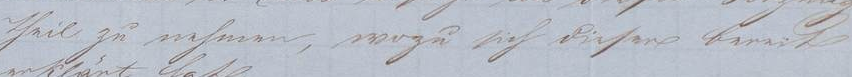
Theil zu nehmen, wozu sich dieser bereit
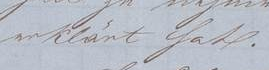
erklärt hat.
